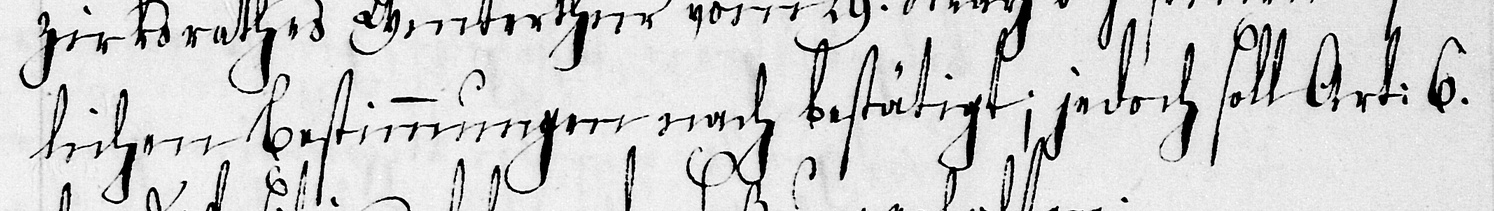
lichen Bestimmungen nach bestätigt; jedoch soll Art. 6.
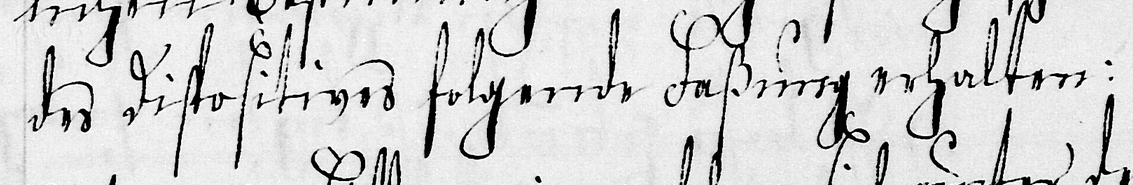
des Dispositives folgende Faßung erhalten:
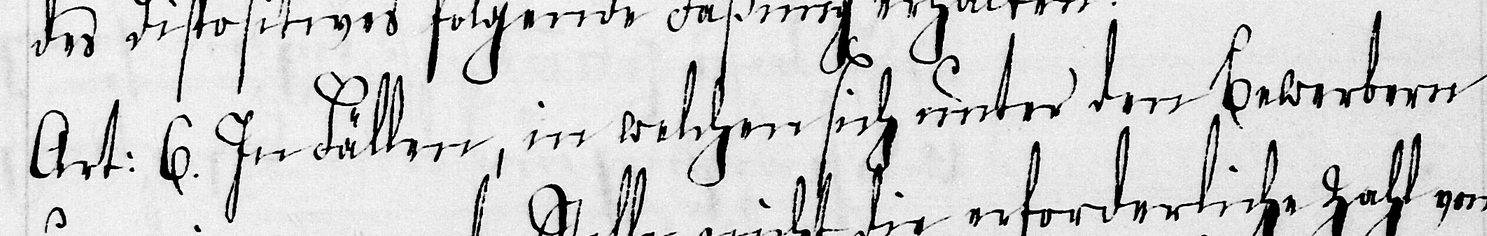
Art: 6. In Fällen, in welchen sich unter den Bewerbern
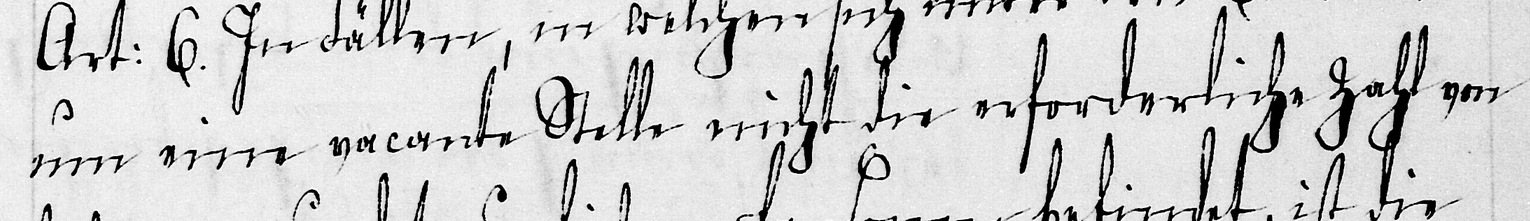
um eine vacante Stelle nicht die erforderliche Zahl von
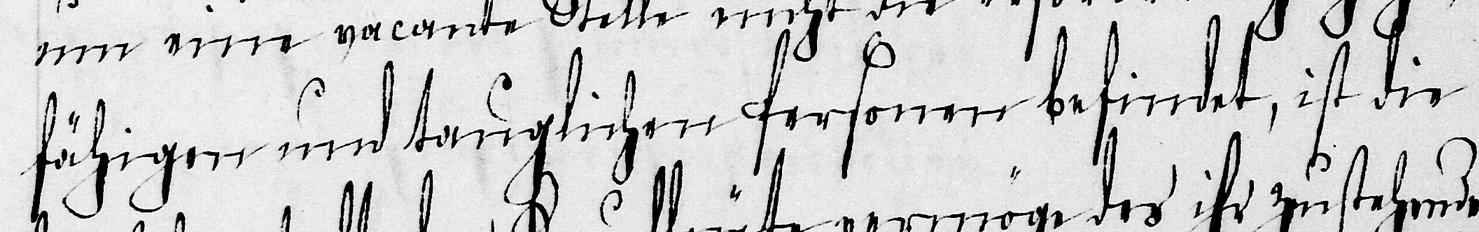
fähigen und tauglichen Personen befindet, ist die
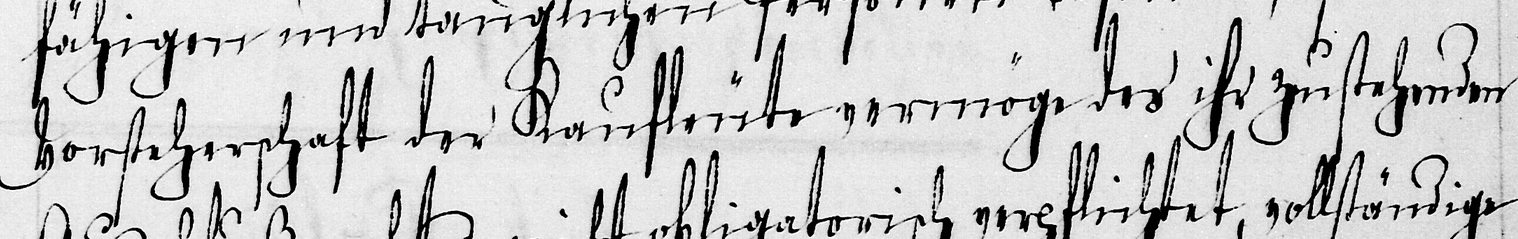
Vorsteherschaft der Kaufleute vermöge des ihr zustehenden
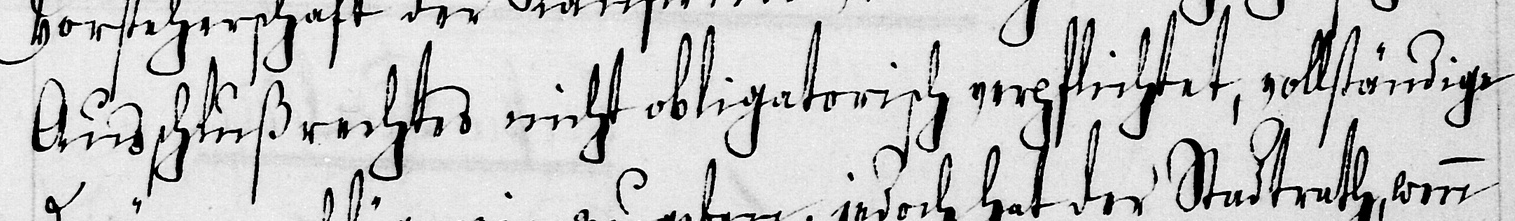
Ausschlußrechtes nicht obligatorisch verpflichtet, vollständi¬
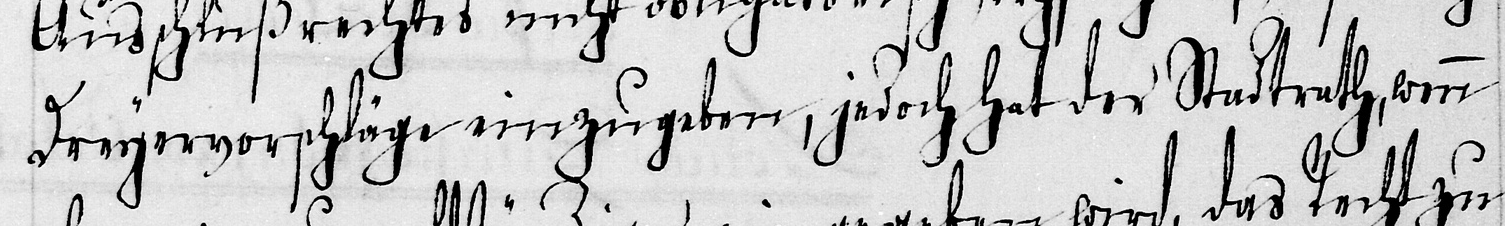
Dreyervorschläge einzugeben, jedoch hat der Stadtrath, wenn
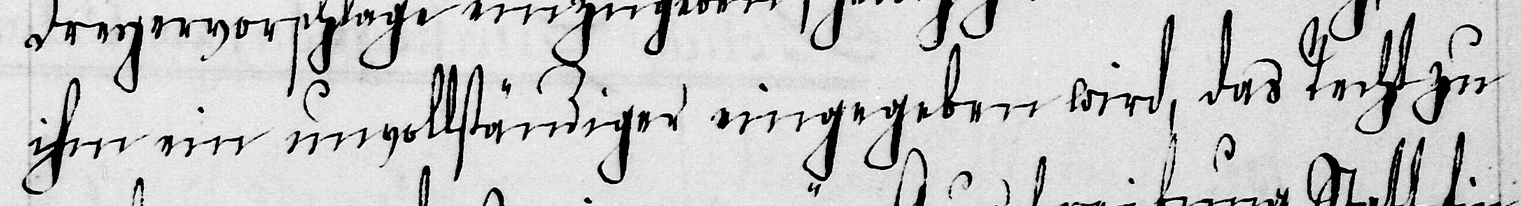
ihm ein unvollständiger eingegeben wird, das Recht zu
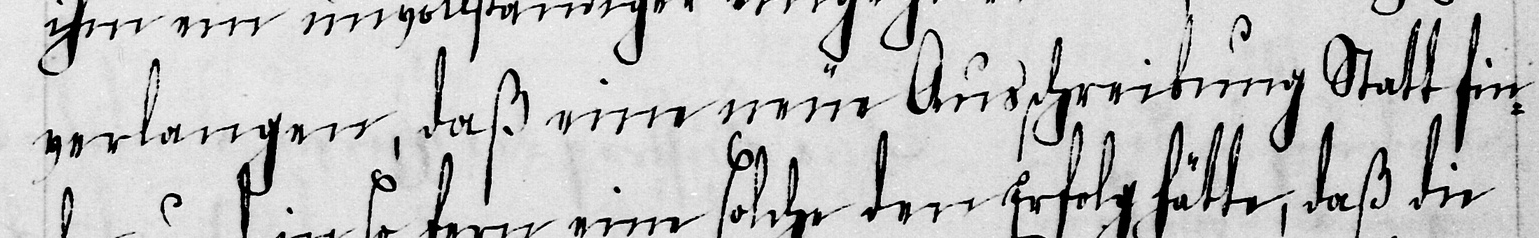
verlangen, daß eine neue Ausschreibung Statt fin¬
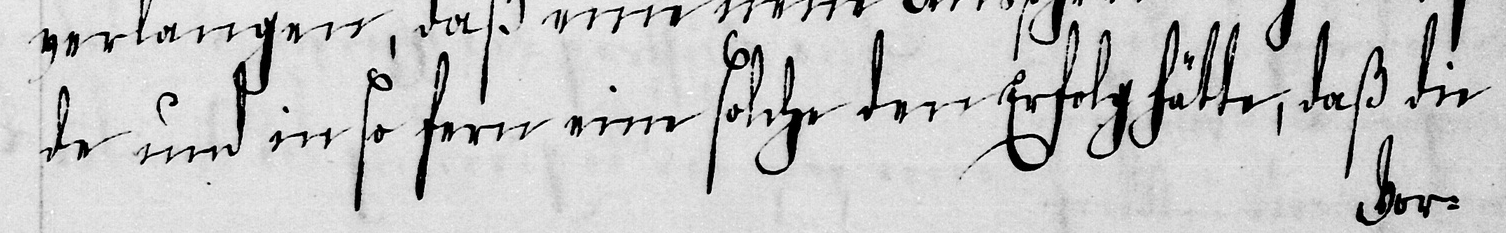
de und in so fern eine solche den Erfolg hätte, daß die
